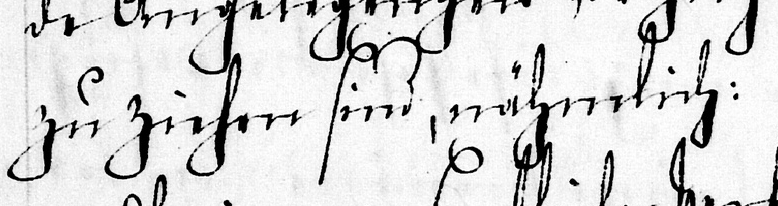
zu ziehen sind, nähmlich:
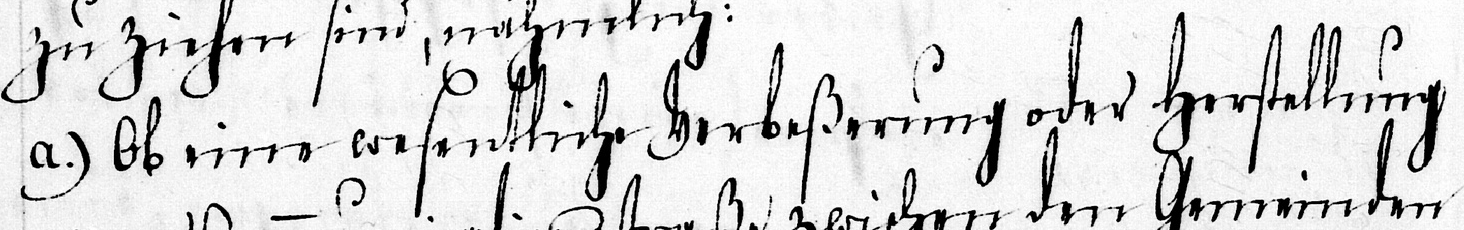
a.) Ob eine wesentliche Verbeßerung oder Herstellung
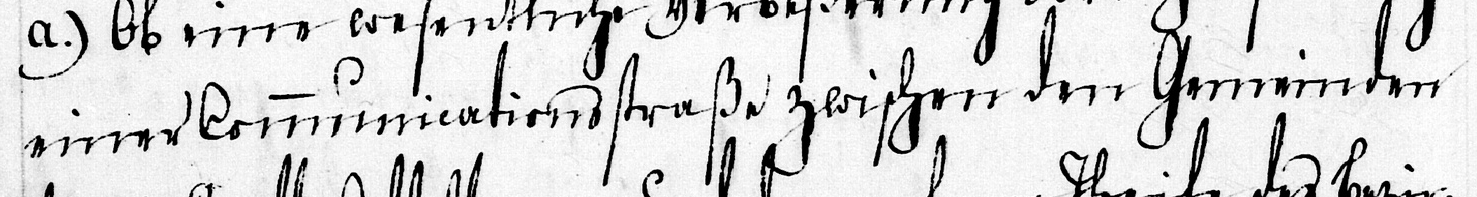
einer Communicationsstraße zwischen den Gemeinden
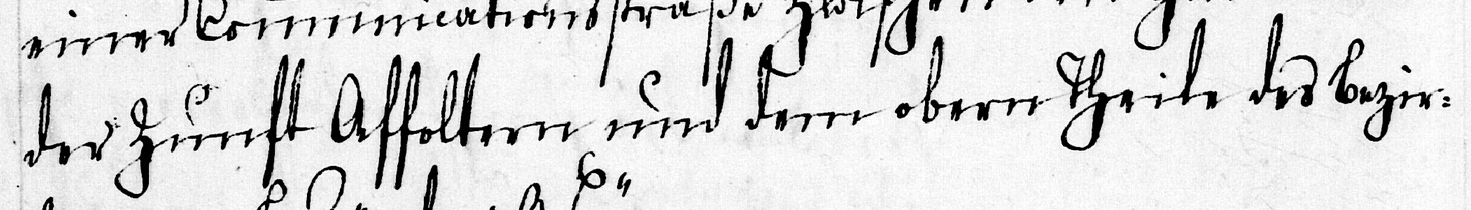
der Zunft Affoltern und dem obern Theile des Bezir¬
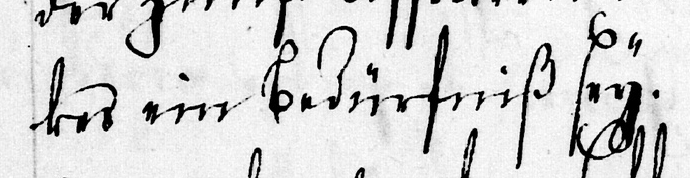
kes ein Bedürfniß sey.
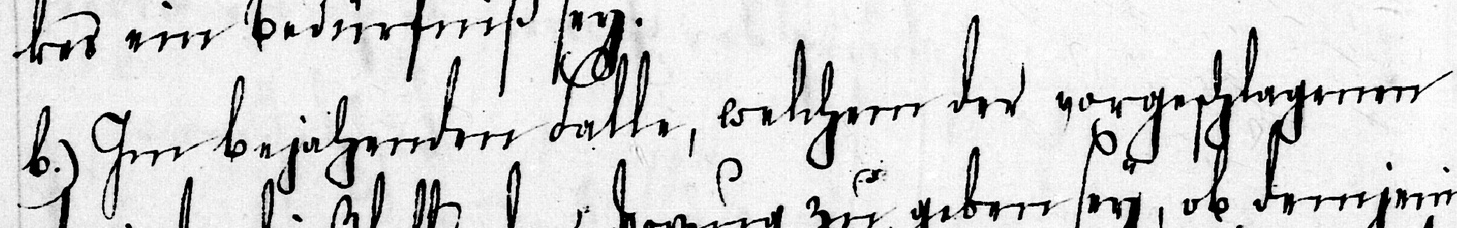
b.) Im bejahende Falle, welchem der vorgeschlagenen
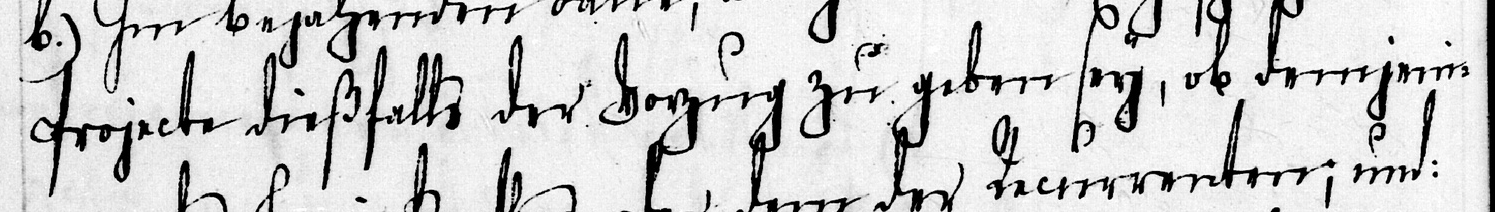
Projecte dießfalls der Vorzug zu geben sey, ob demjeni¬
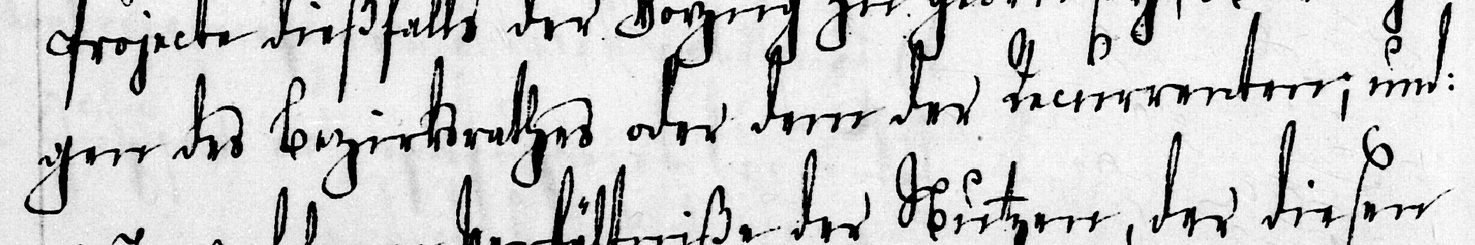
gen des Bezirksrathes oder dem der Recurrenten; und:
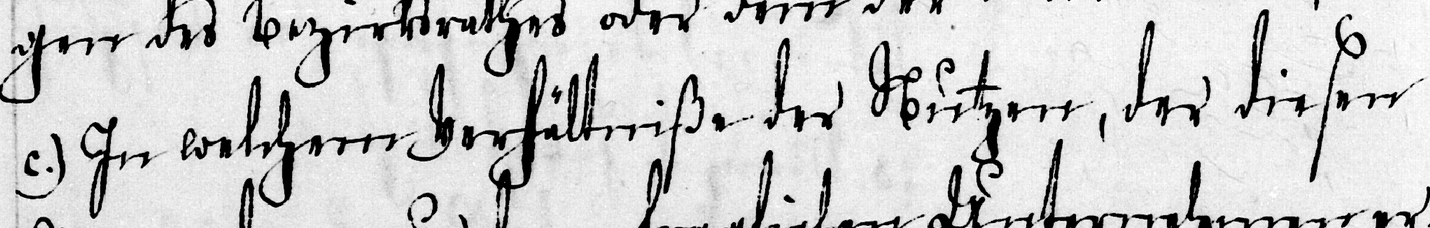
c.) In welchem Verhältniße der Nutzen, der diesen
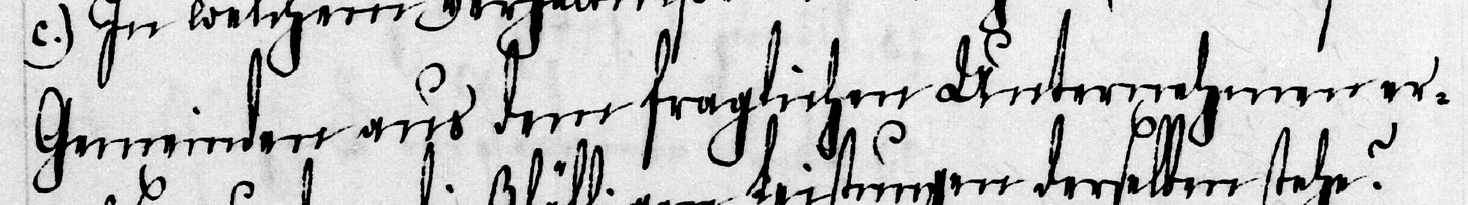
Gemeinden aus dem fraglichen Unternehmen er¬
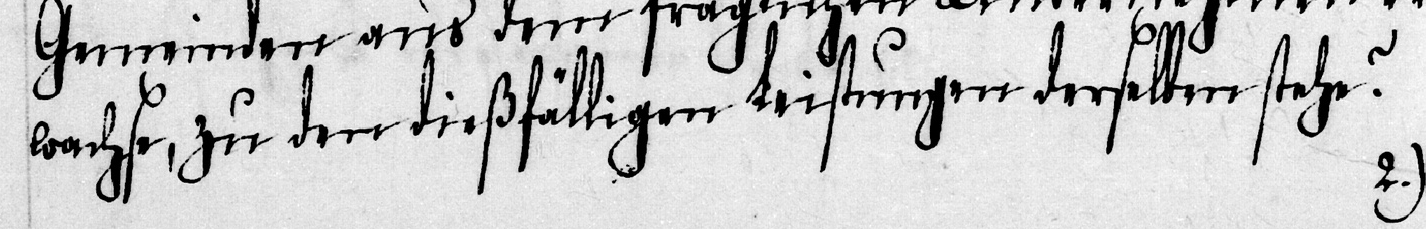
wachse, zu den dießfälligen Leistungen derselben stehe?
